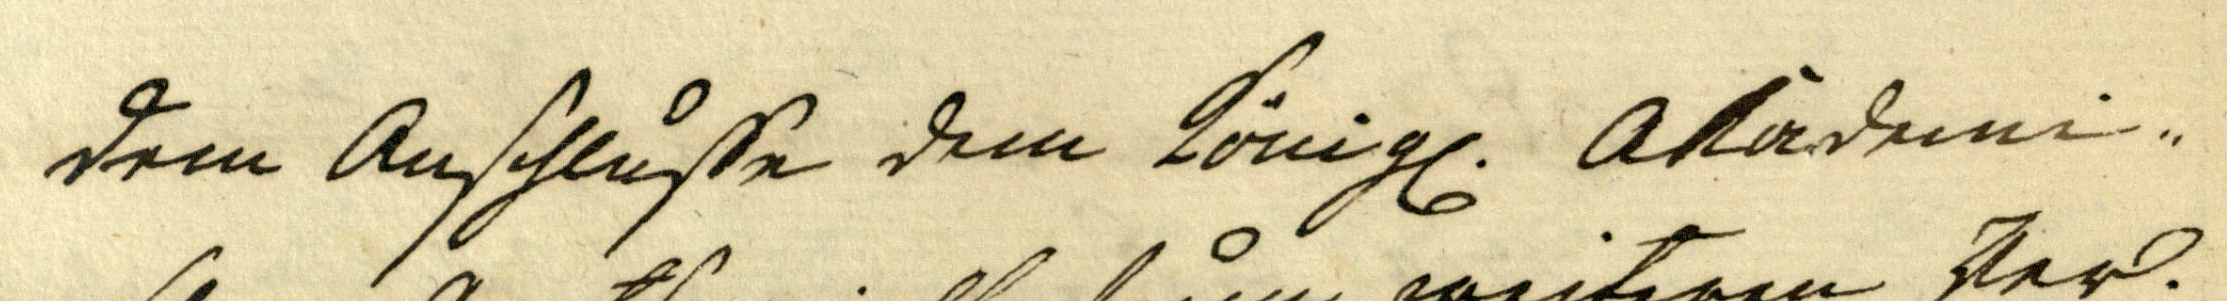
dem Anschlusse dem Königl. Akademi¬
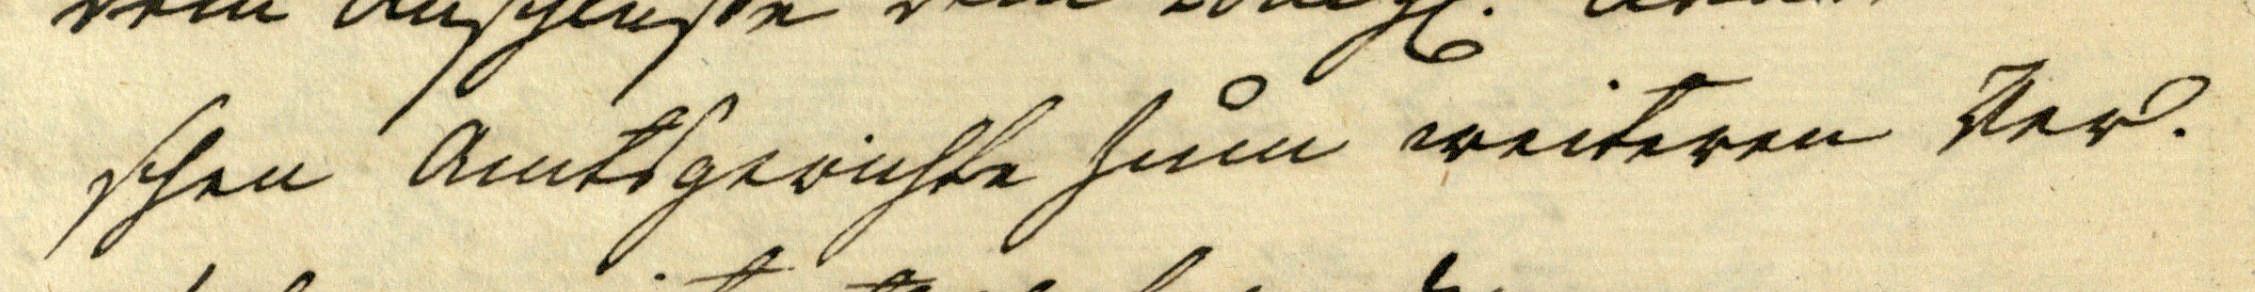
schen Amtsgerichte zum weiteren Ver¬
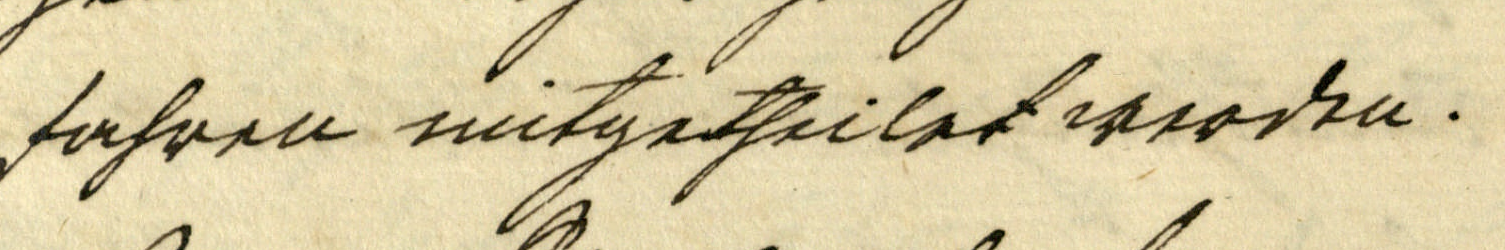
fahren mitgetheilet werden.
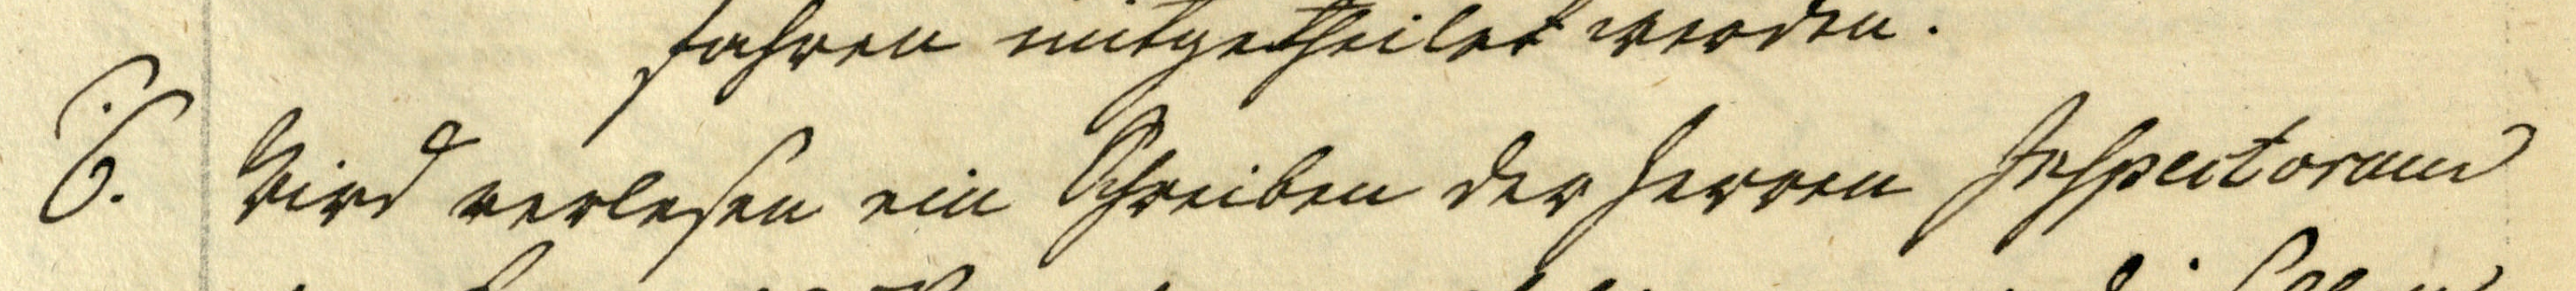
6. Wird verlesen ein Schreiben der Herren Inspectorum
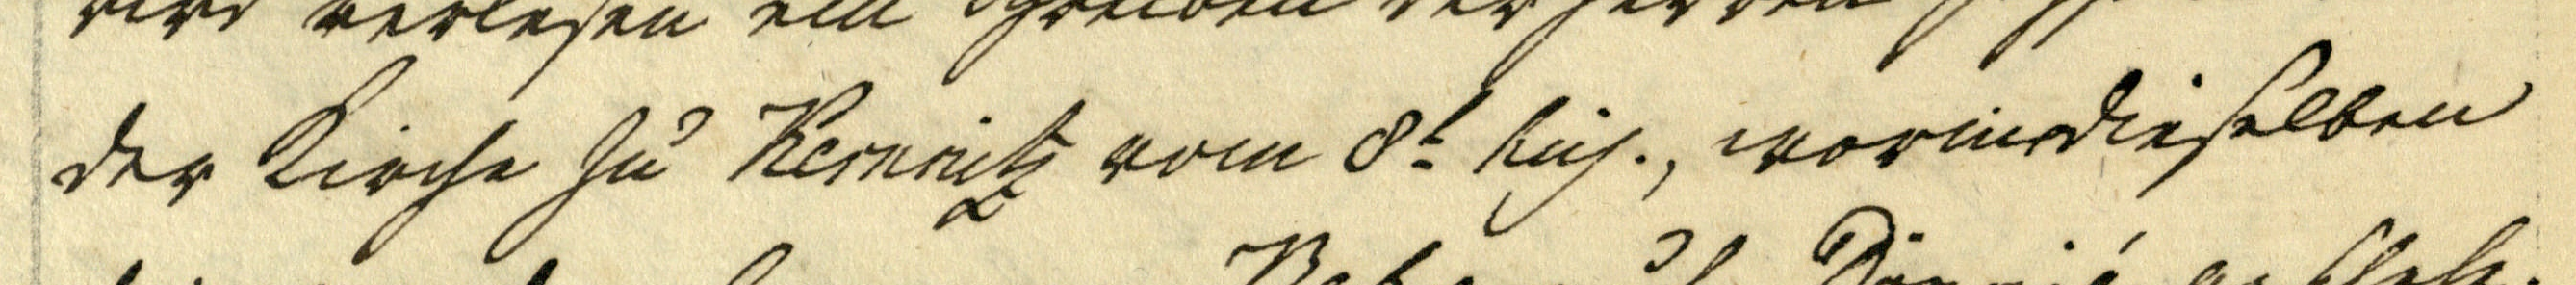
der Kirche zu Kemnitz vom 8 t huj. worindieselben
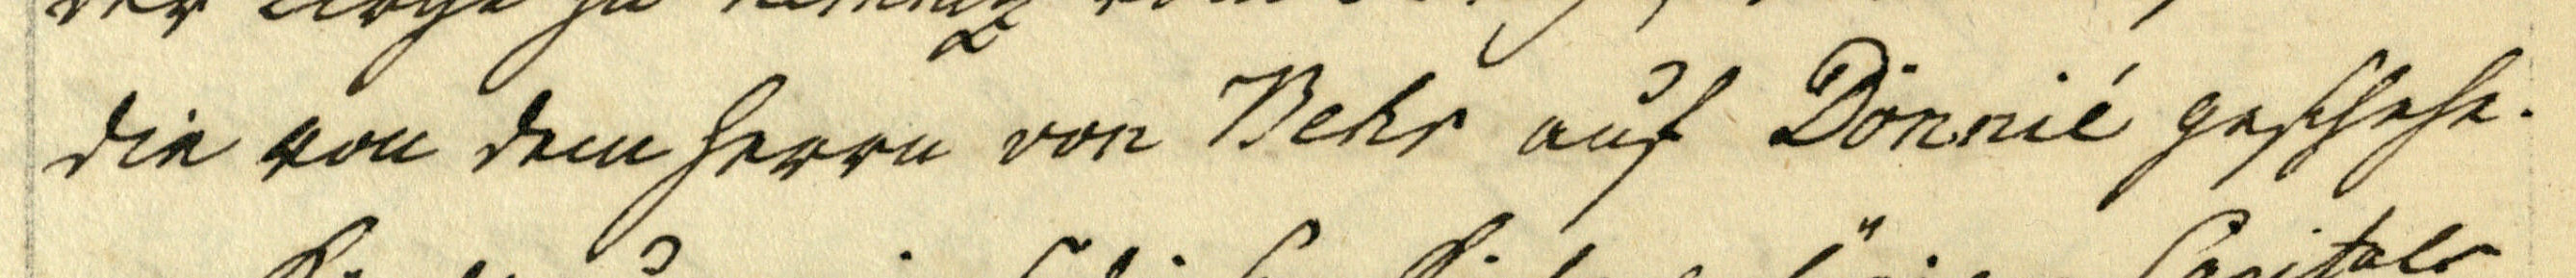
die von dem Herrn von Behr auf Dönnié geschehe¬
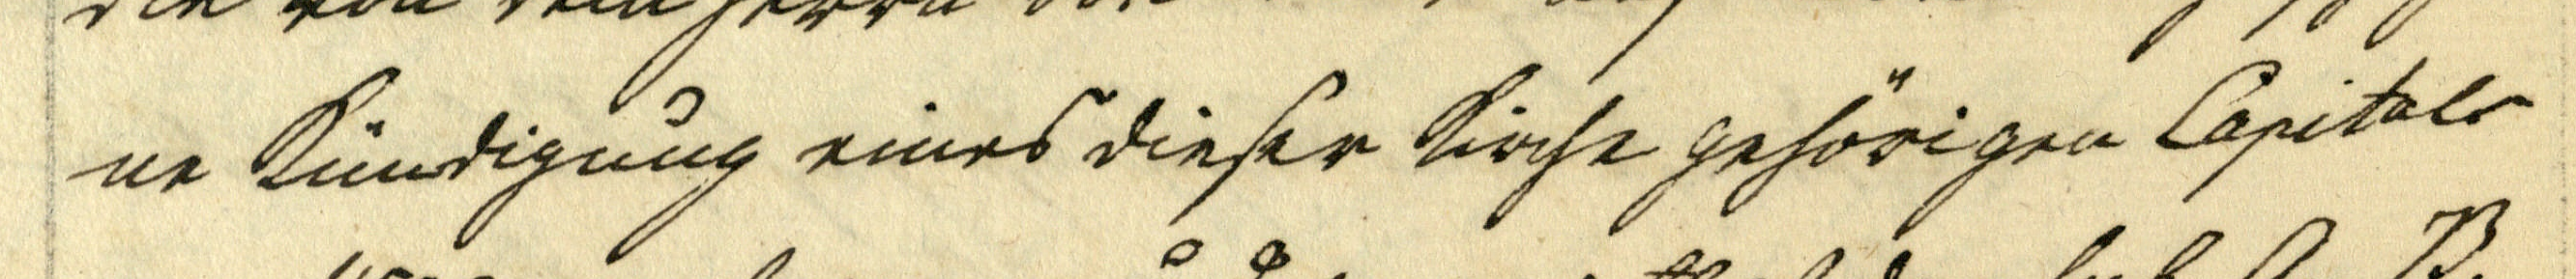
ne Kündigung eines dieser Kirche gehörigen Capitals
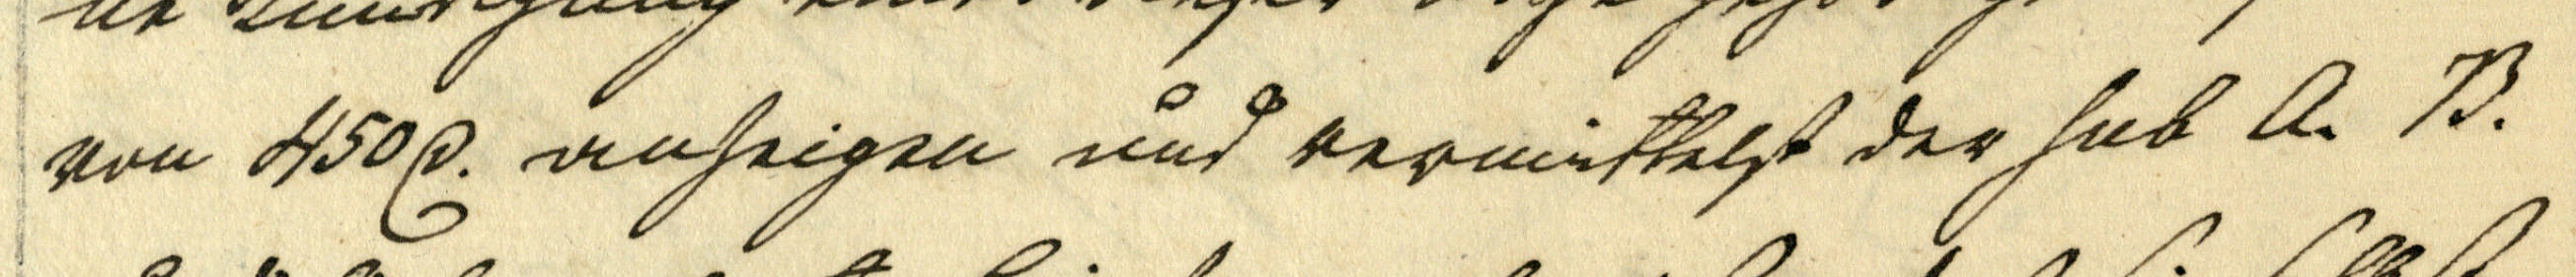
von 450 l. anzeigen und vermittelst der sub A. B.
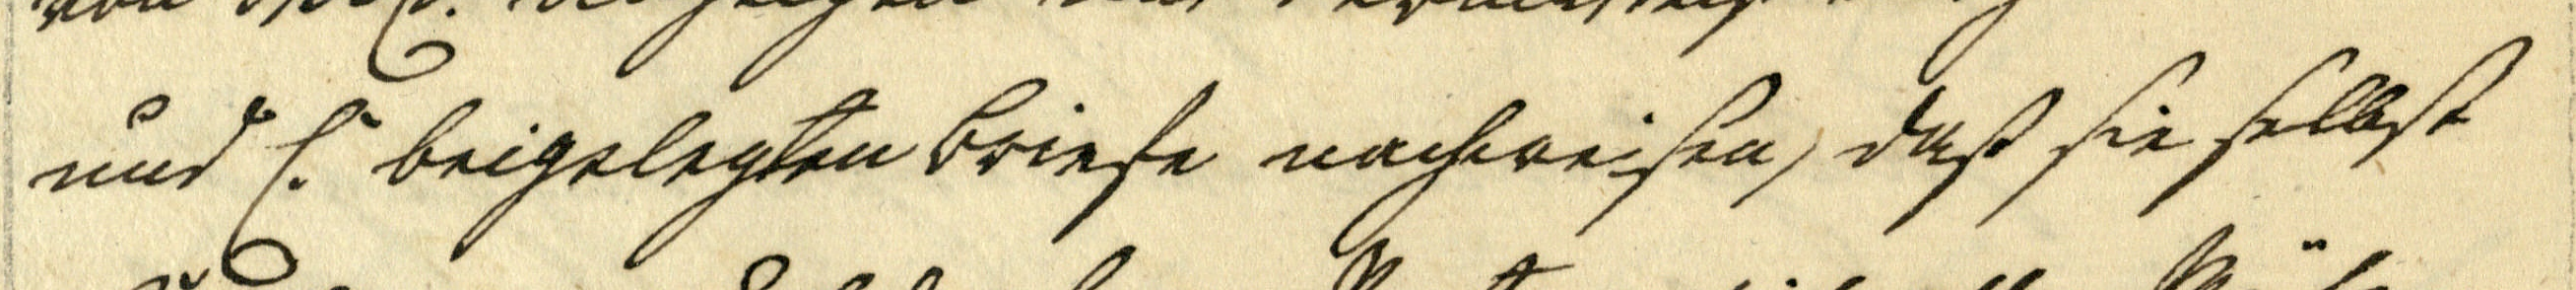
und C. beigelegten Briefe nachweisen, daß sie selbst
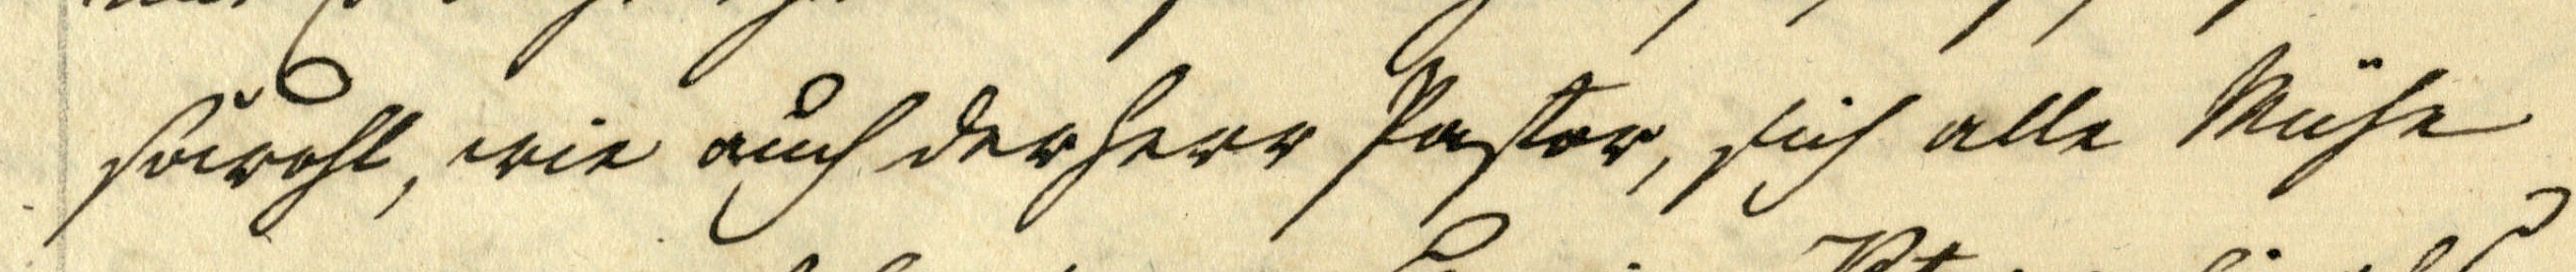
sowohl, wie auch der Herr Pastor, sich alle Mühe
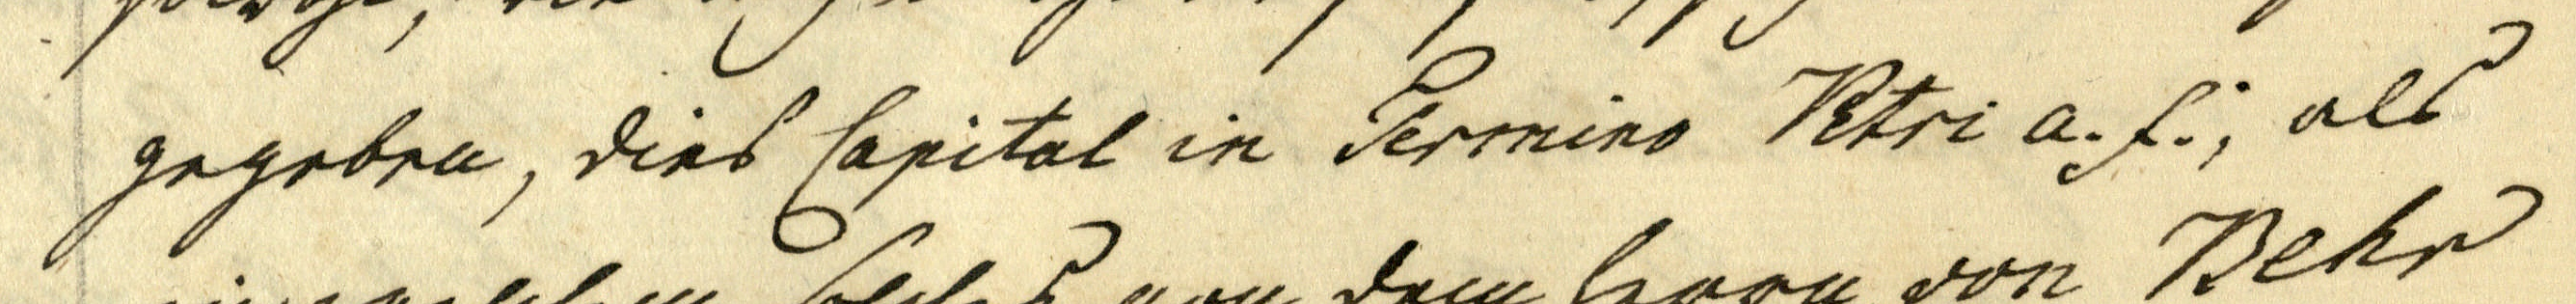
gegeben, dies Capital in Termino Petri a. f., als
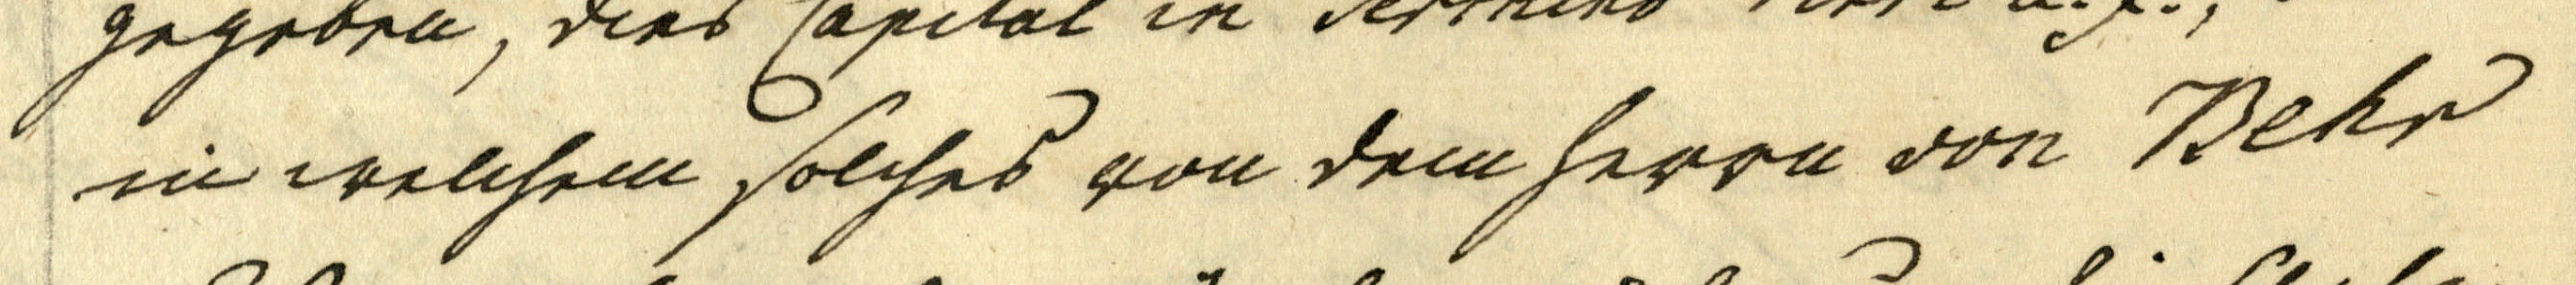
in welchem solches von dem Herrn von Behr
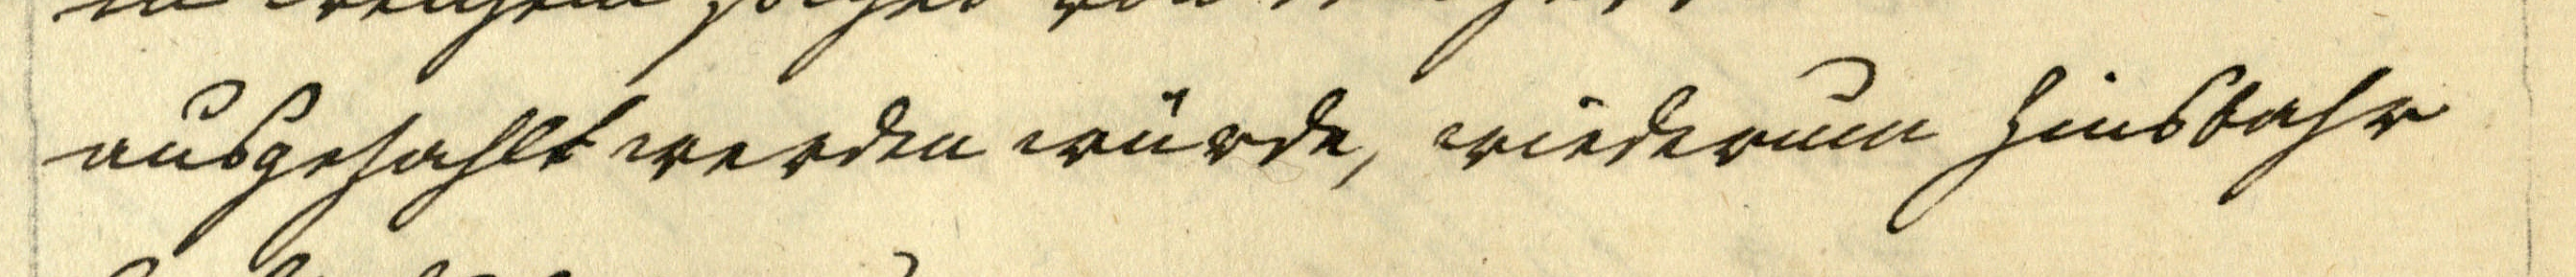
ausgezahlt werden würde, wiederum zinsbahr
